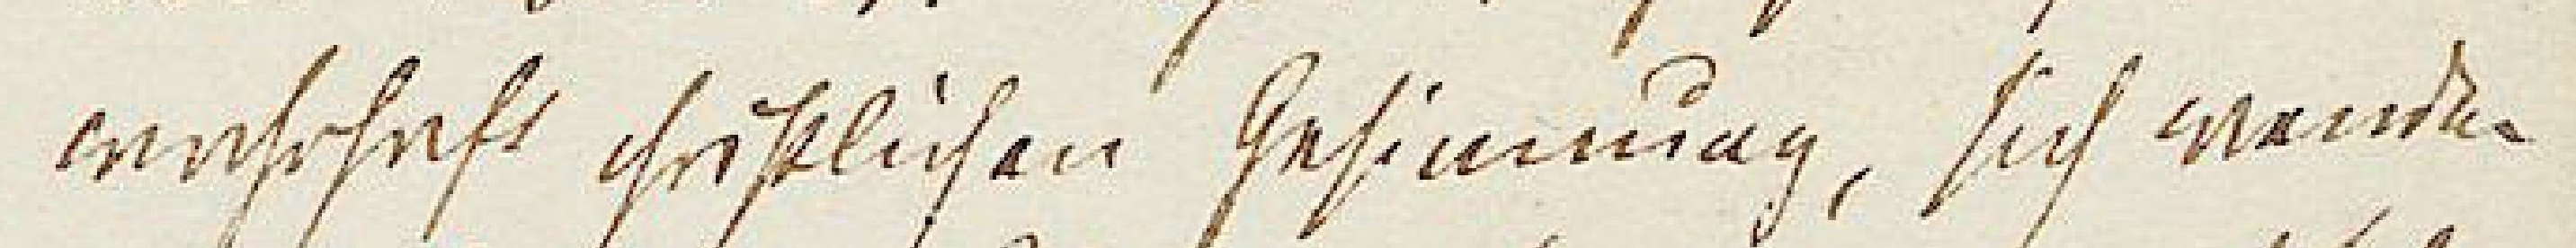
wahrhaft christlichen Gesinnung, sich wenden
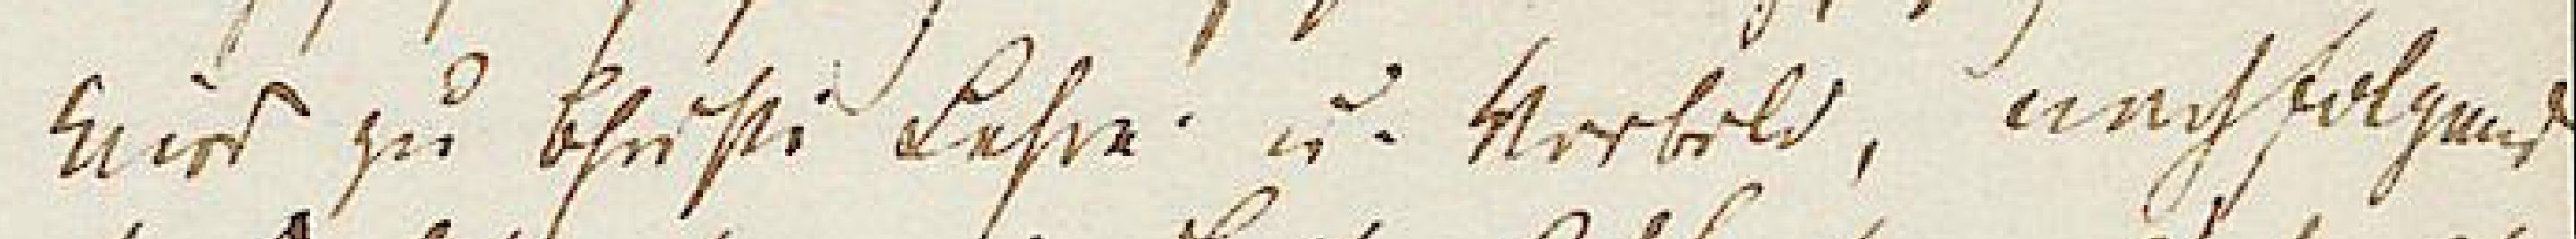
wird zu Christi Lehr u. Vorbild, nachfolgend
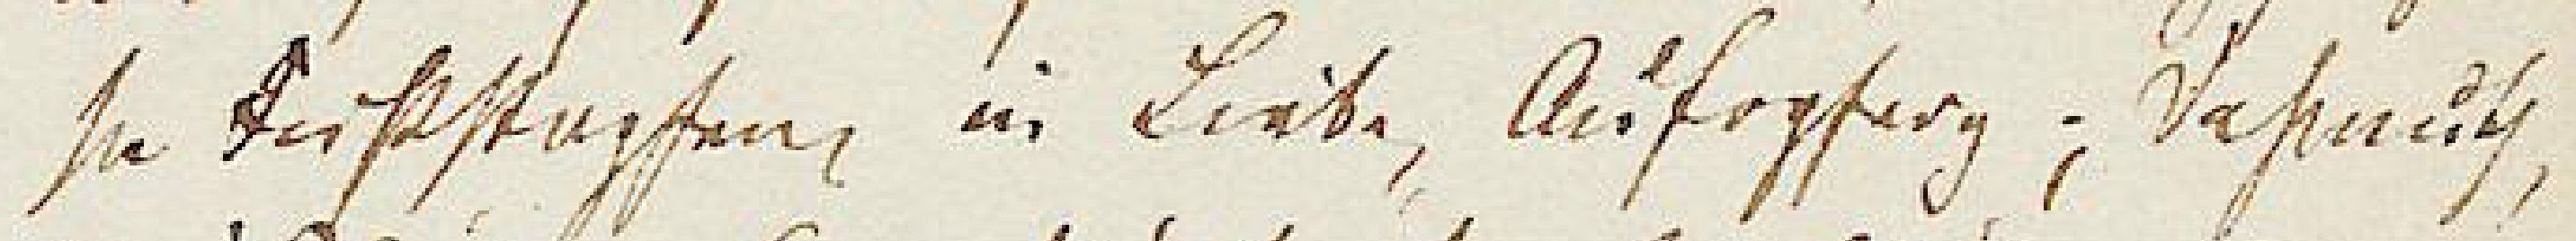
sn Fußstapfen, in Liebe, Aufopferg, Dehmuth,
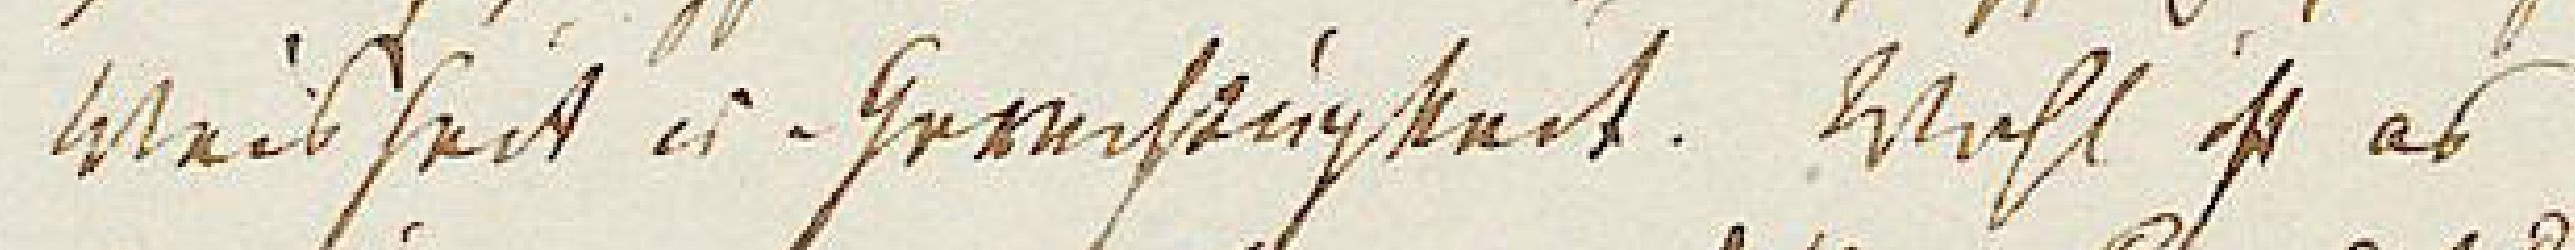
Weisheit u. Gerechtigkeit. Wohl ist es
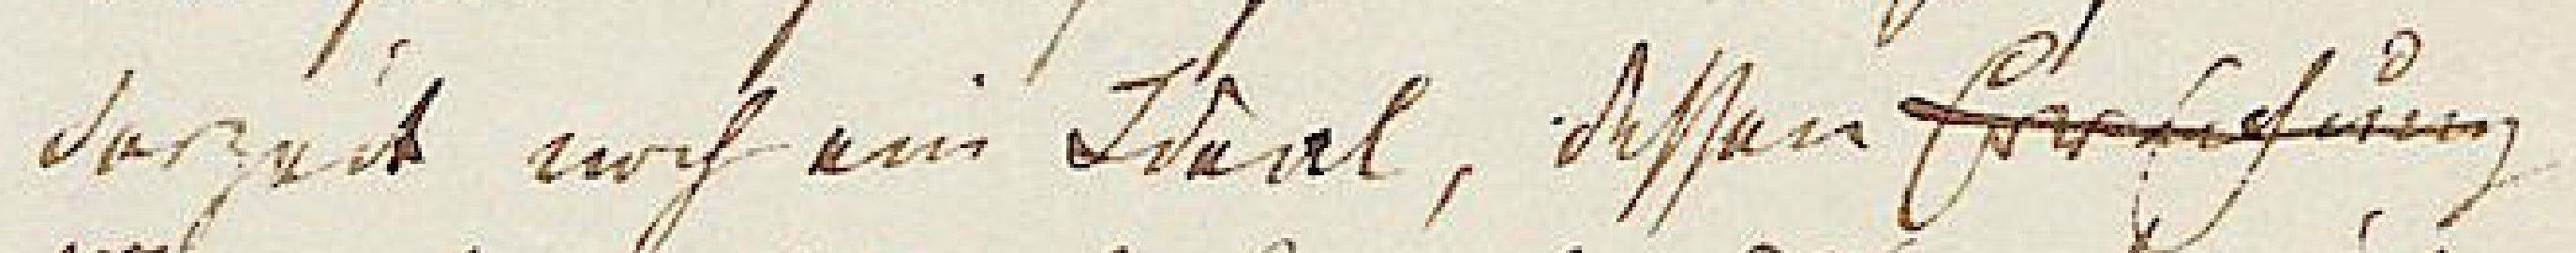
derzeit noch ein Ideal, dessen Erreichung
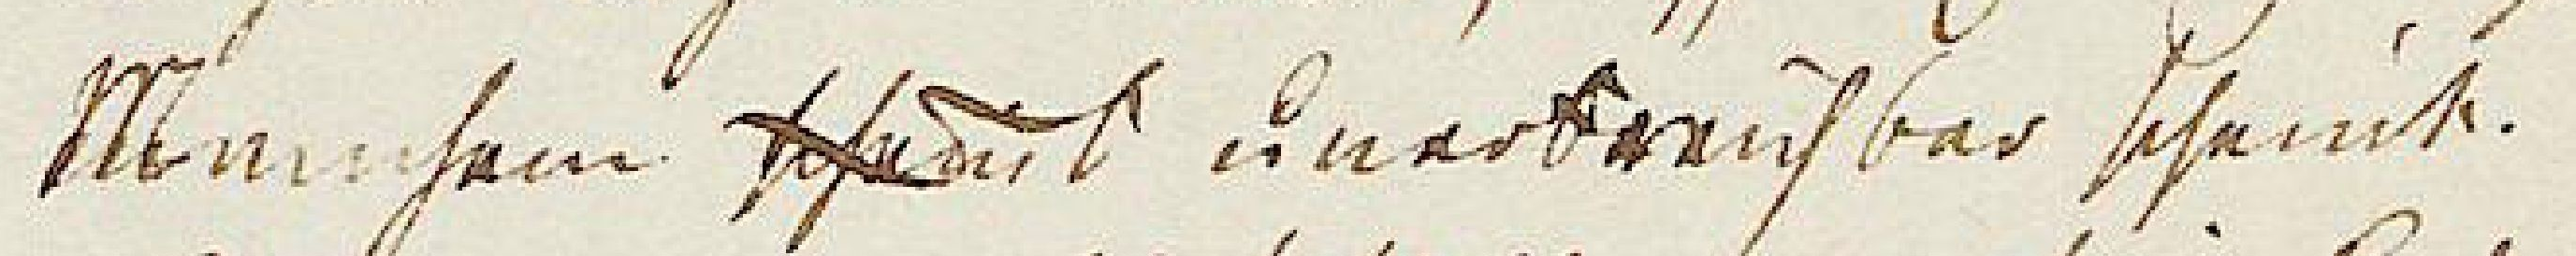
Menschen scheint unersreichbar scheinte.
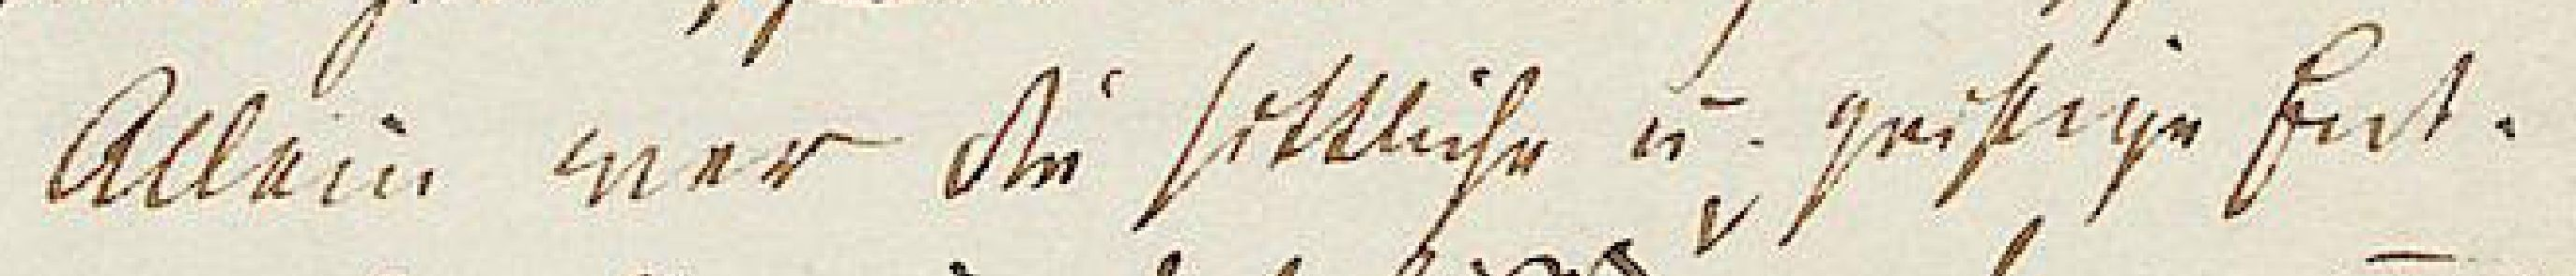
Allein war die sittliche u. geistige Ent¬
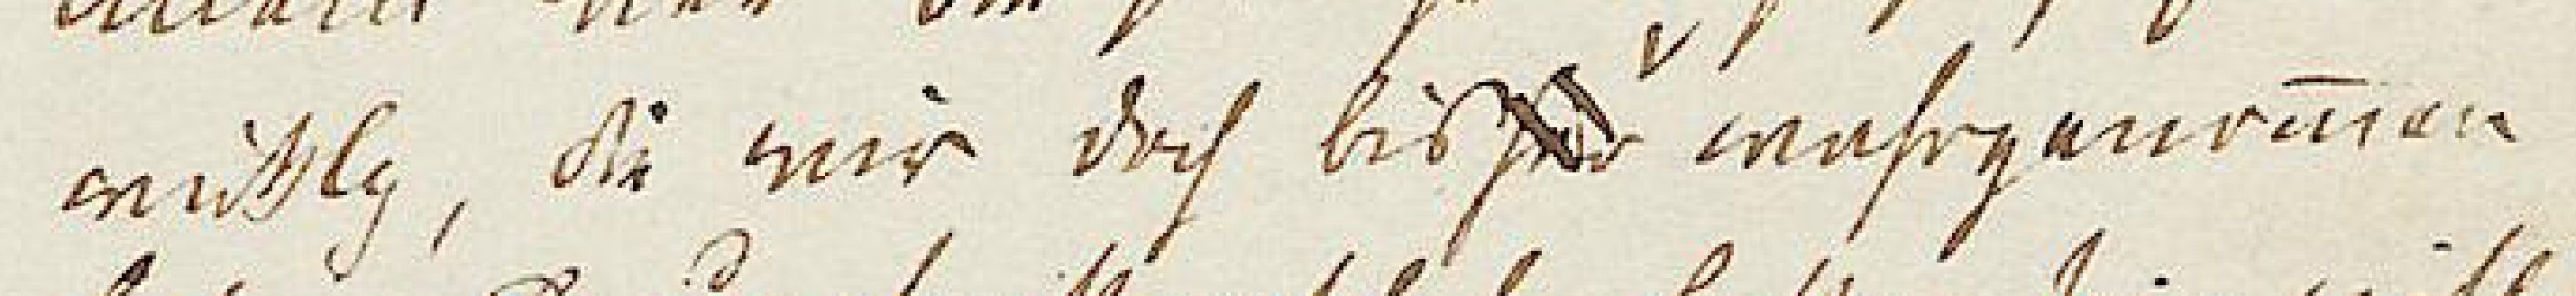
wicklg, die wir doch bisher wahrgenomen
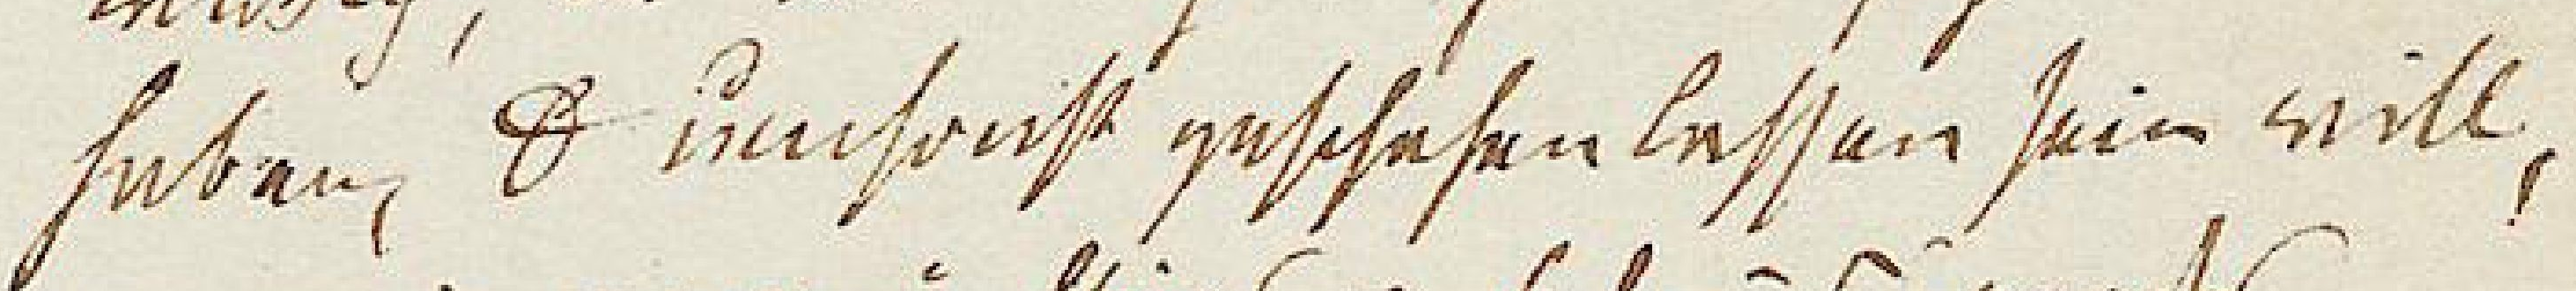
haben, o umsonst geschehen lassen sein will,
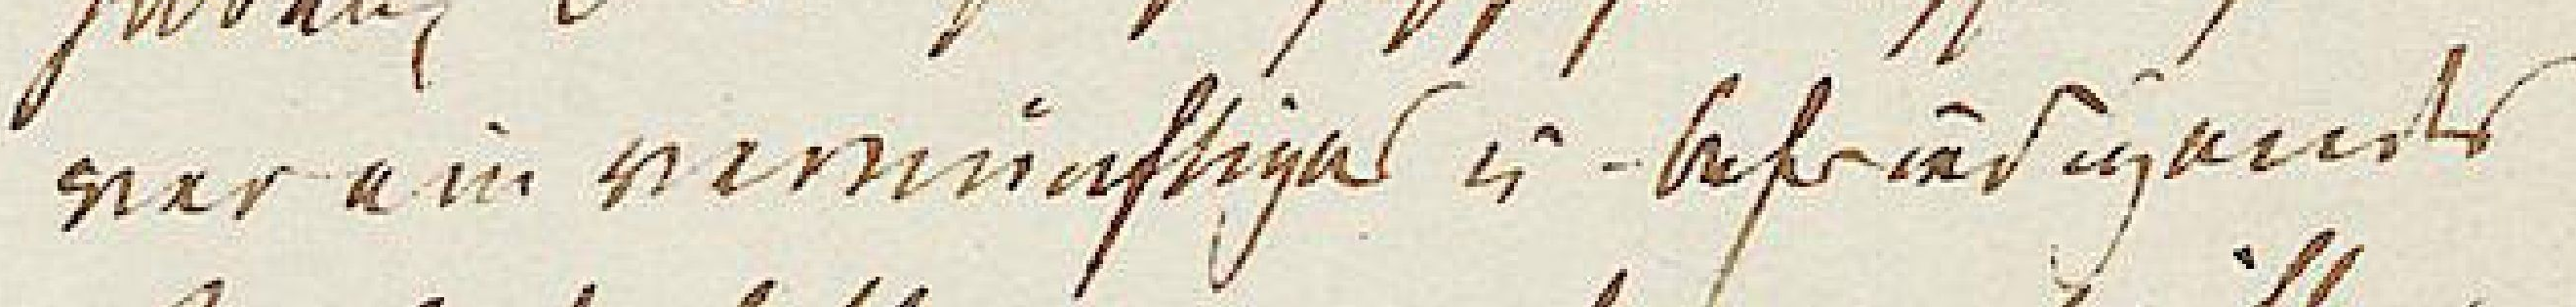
war ein vernünftiges u. befriedigendes
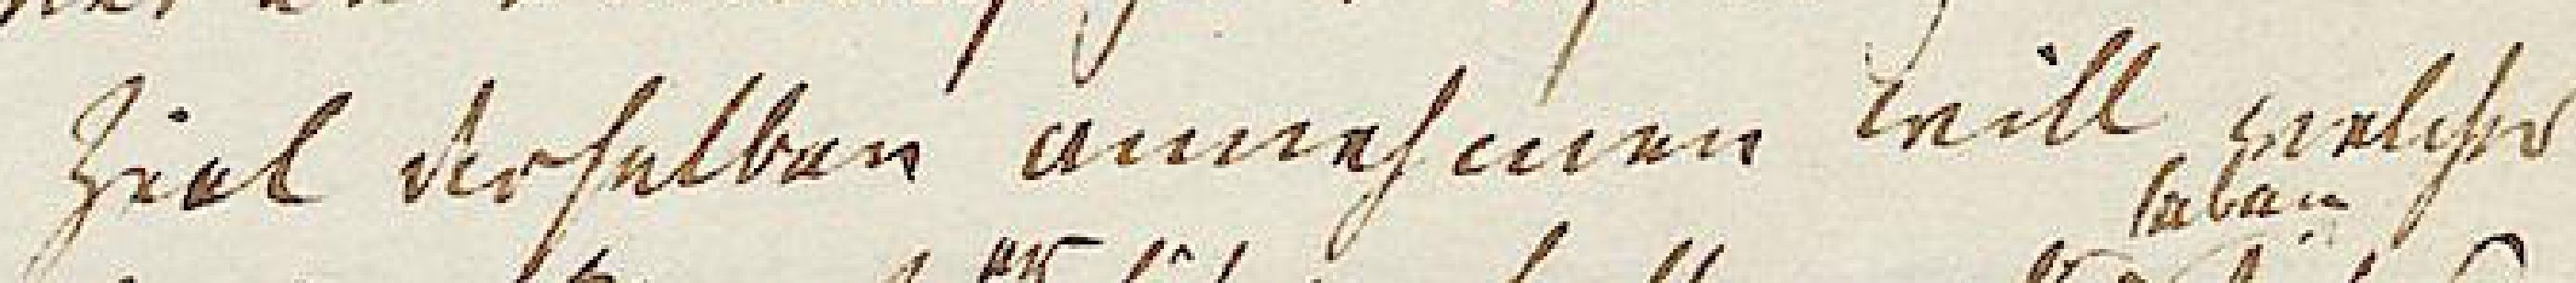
Ziel derselben annehmen will welches
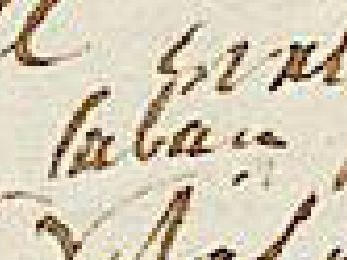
leben
